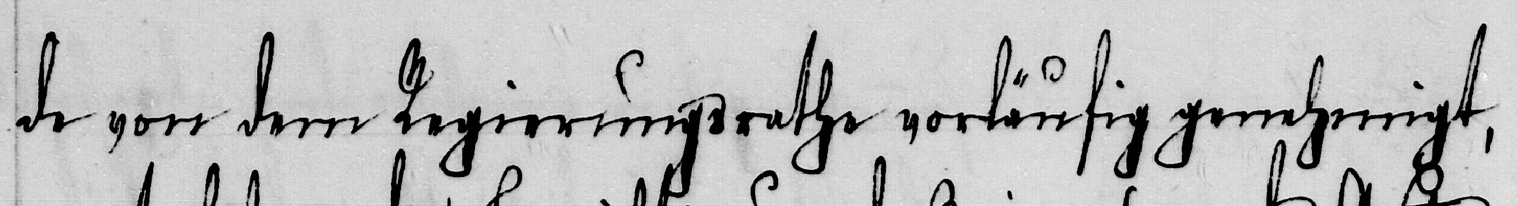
de von dem Regierungsrathe vorläufig genehmigt,
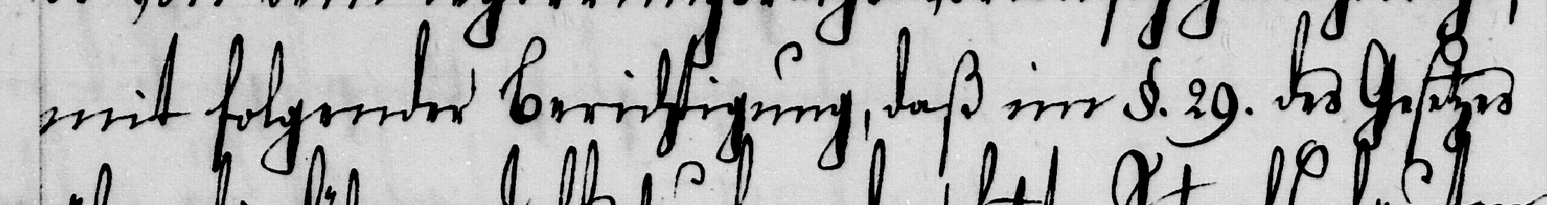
mit folgender Berichtigung, daß im §. 29. des Gesetzes
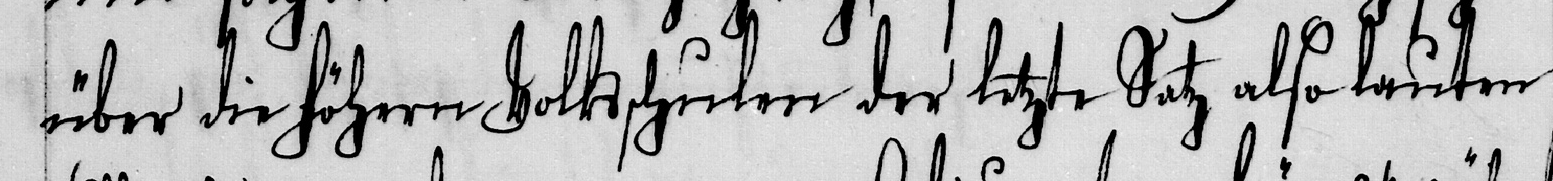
über die Höhern Volksschulen der letzte Satz also lauten
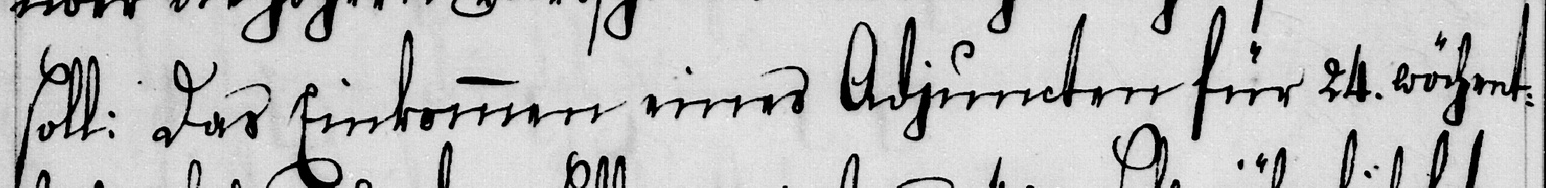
soll: Das Einkommen eines Adjuncten für 24. wöchen¬
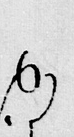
d.
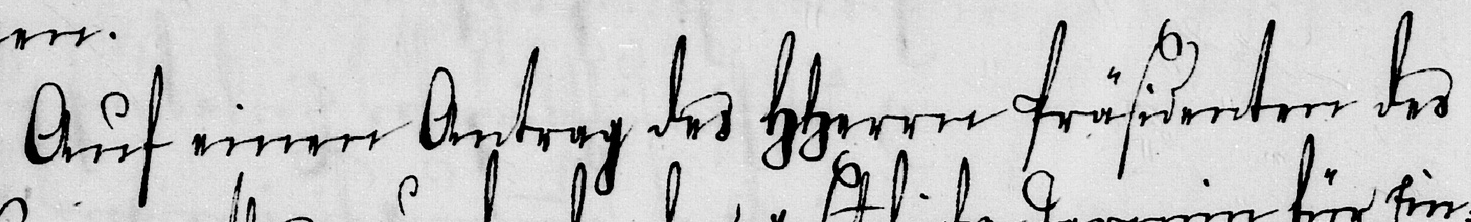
Auf einen Antrag des HHerrn Präsidenten des
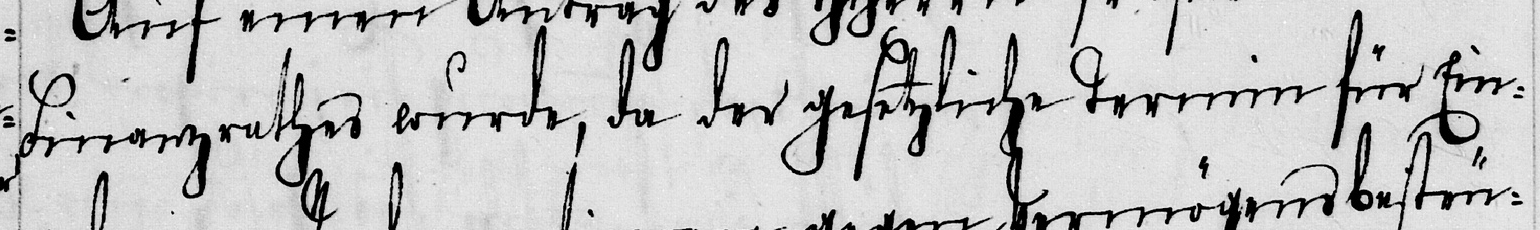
Finanzrathes wurde, da der gesetzliche Termin für Ein¬
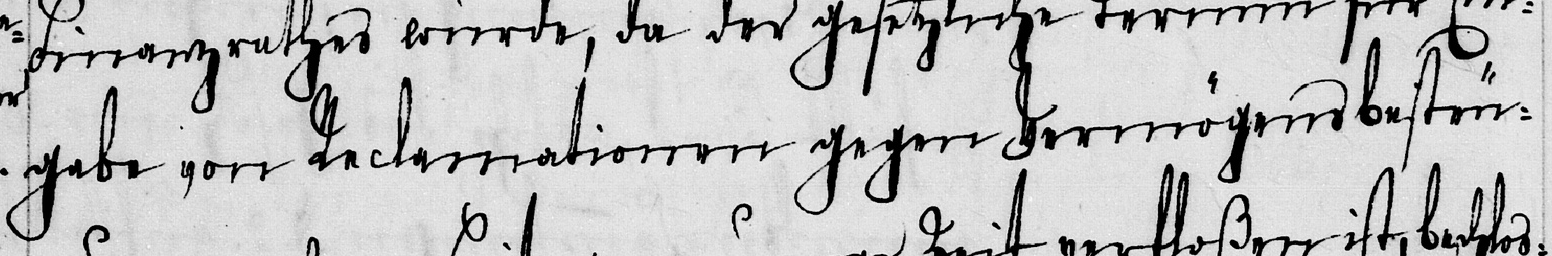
gabe von Reclamationen gegen Vermögensbesteu¬
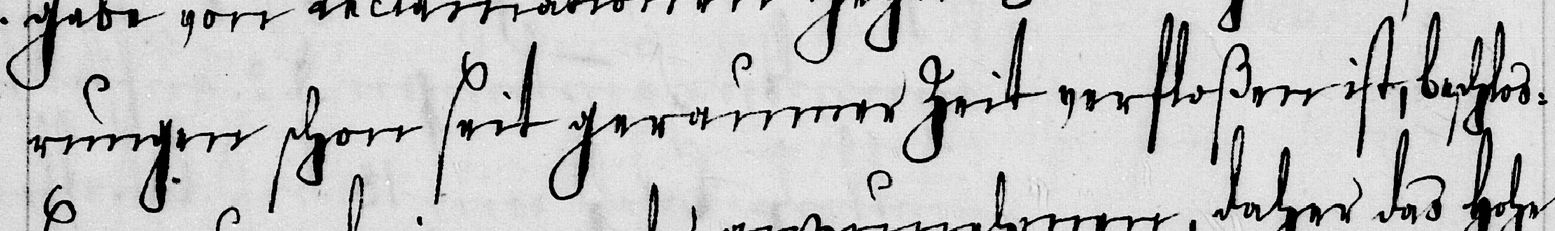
rungen schon mit geraumer Zeit verfloßen ist, beschl¬
